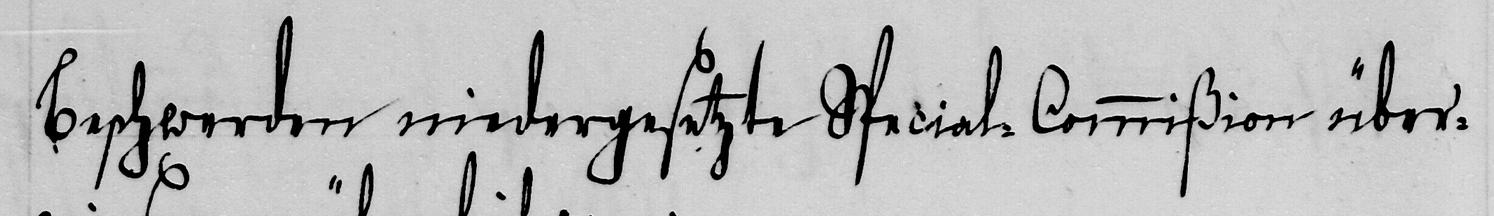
Beschwerden niedergesetzte Special-Commißion über¬
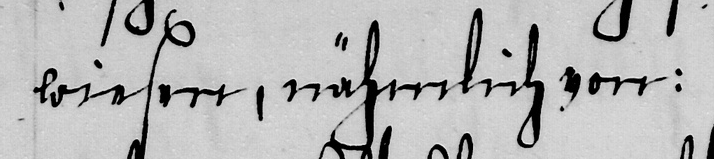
wiesen, nähmlich von:
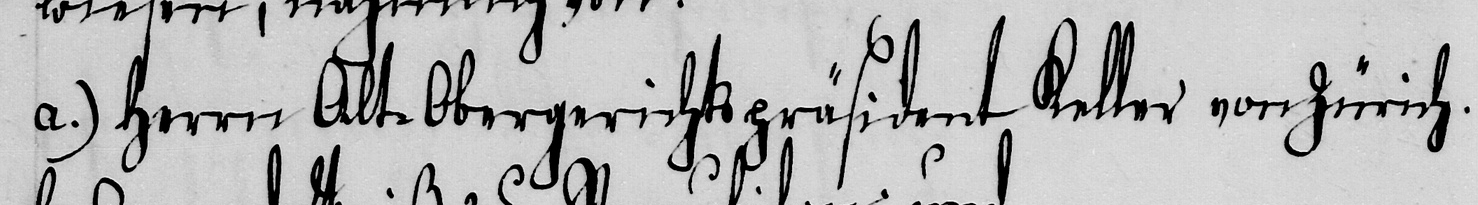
a.) Herrn Alt-Obergerichtspräsident Keller von Zürich.
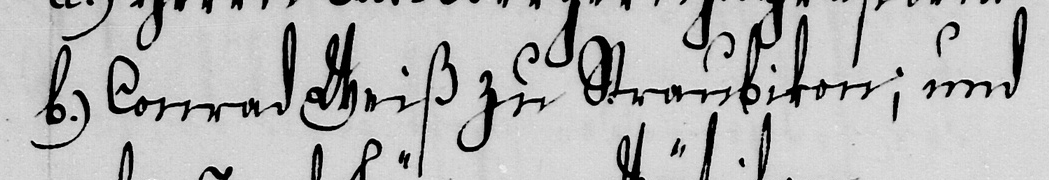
b.) Conrad Weiß zu Straubikon; und
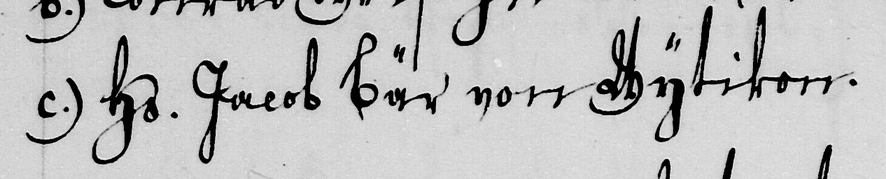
c.) Hs. Jacob Bär von Wytikon.
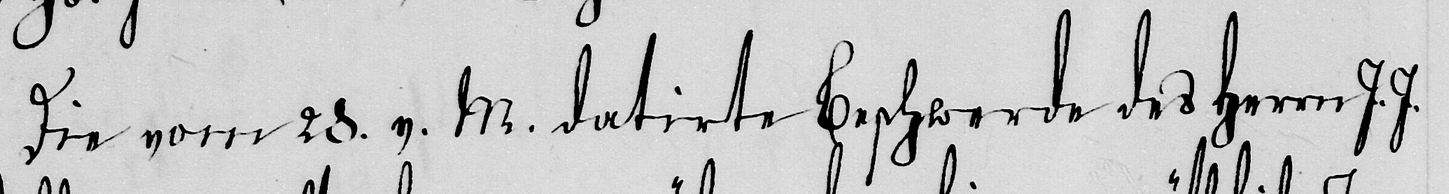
Die vom 28. v. M. datirte Beschwerde des Herrn J.
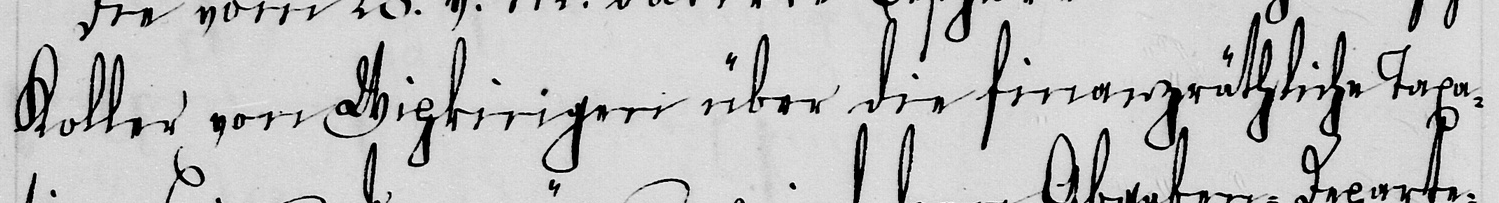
Koller von Wipkingen über die finanzräthliche Taxa¬
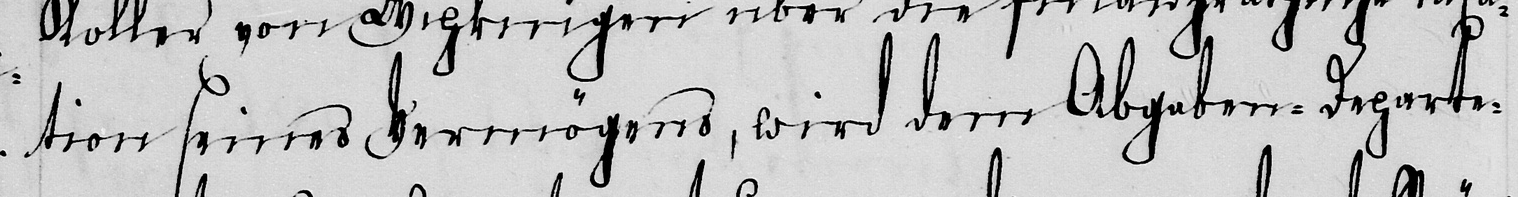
tion seines Vermögens, wird dem Abgaben-Departe¬
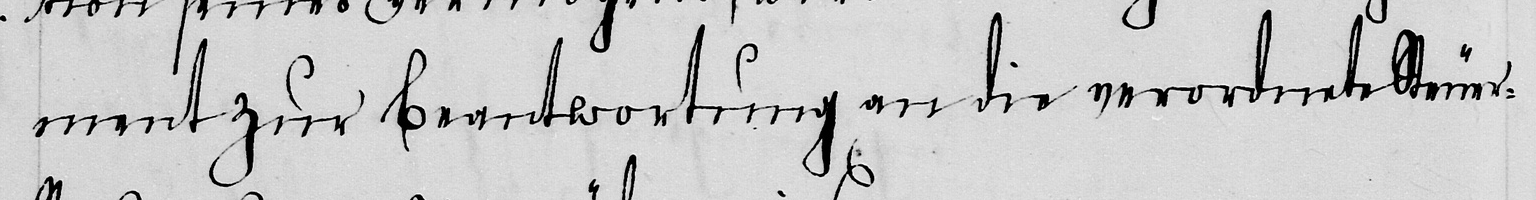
ment zur Beantwortung an die verordnete Steue¬
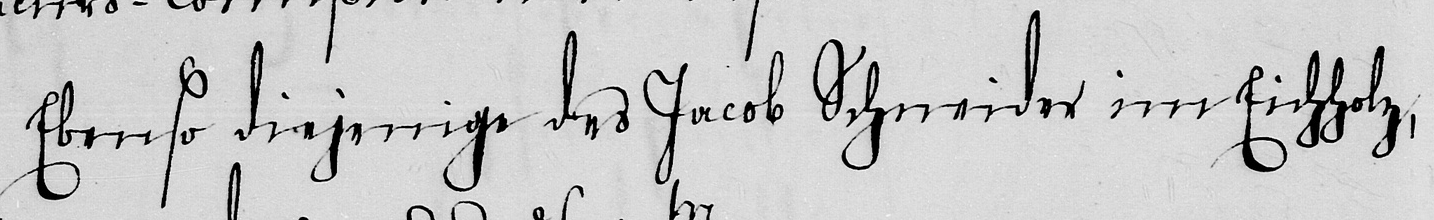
Ebenso diejenige des Jacob Schneider im Eichholz,
